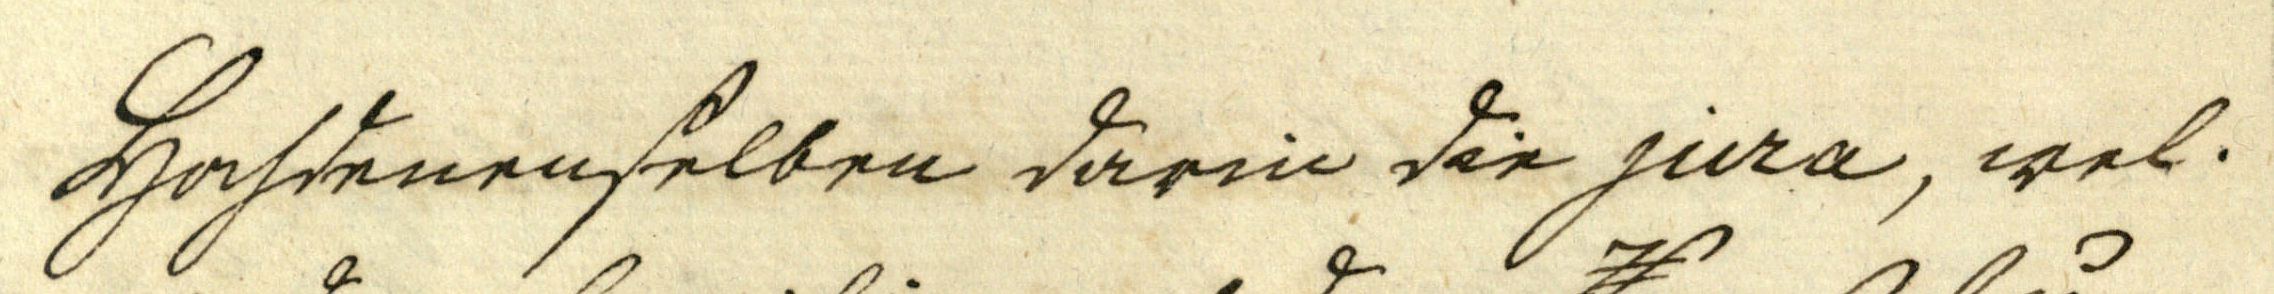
Hochdenenselben darin die jura, wel¬
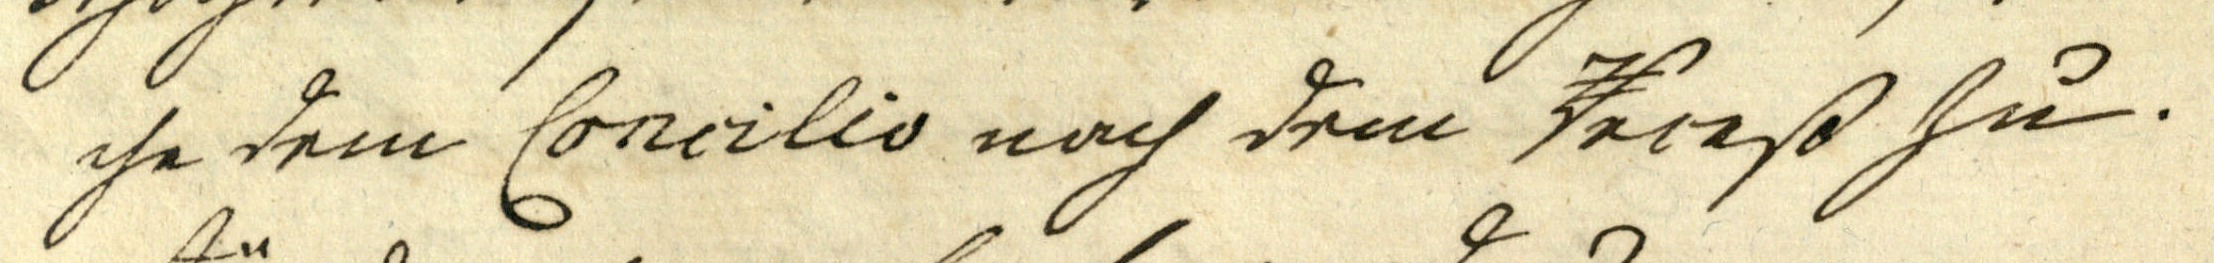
che dem Concilio nach dem Receß zu¬
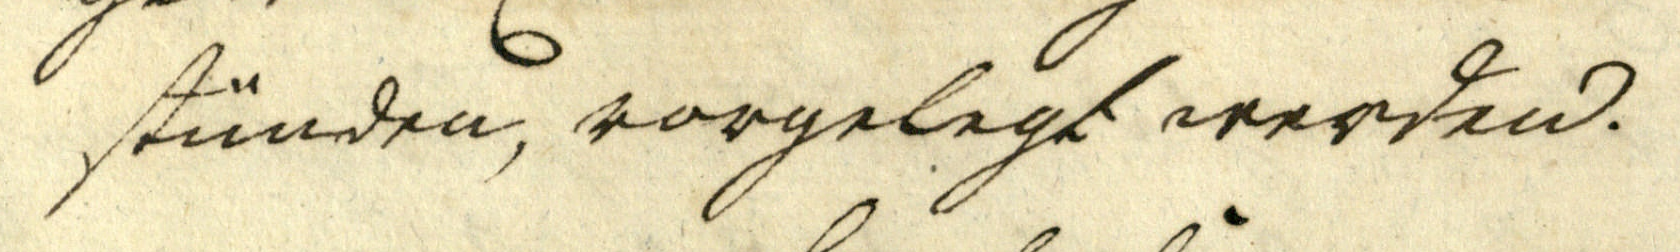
stünden, vorgelegt werden.
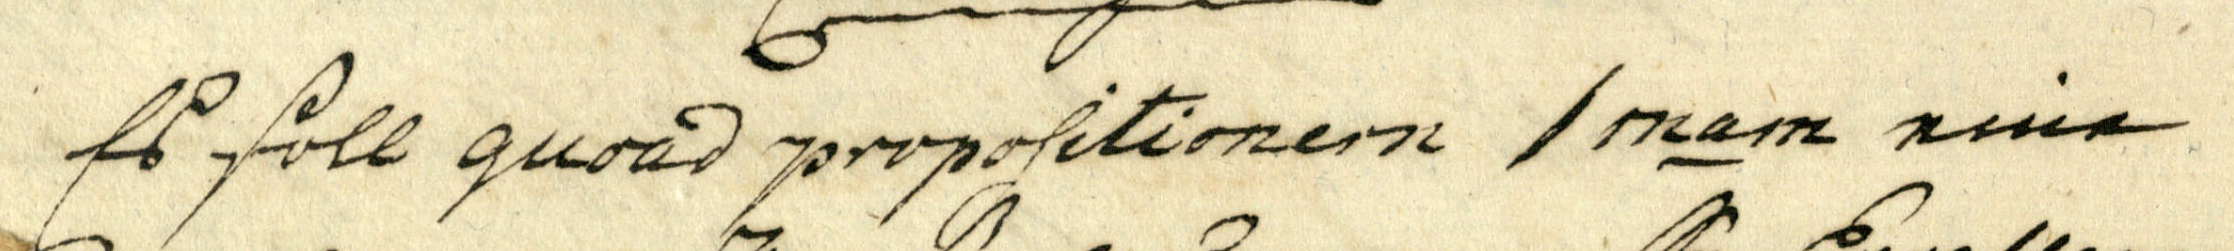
Es soll quoad propositionem / man eine
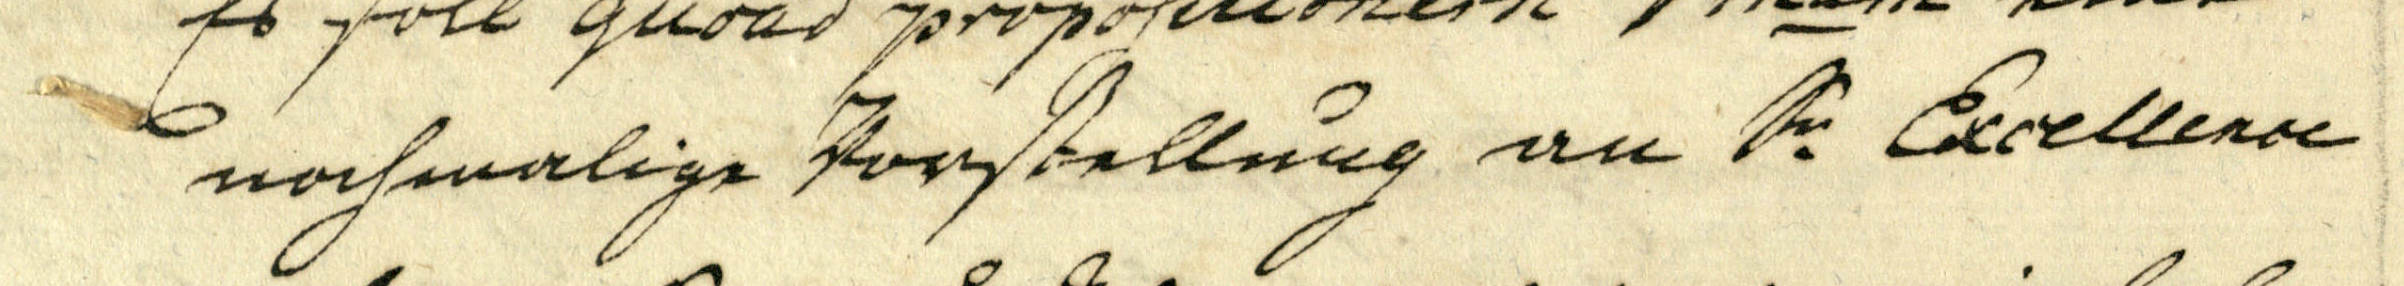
nochmalige Vorstellung an Sr Excellence
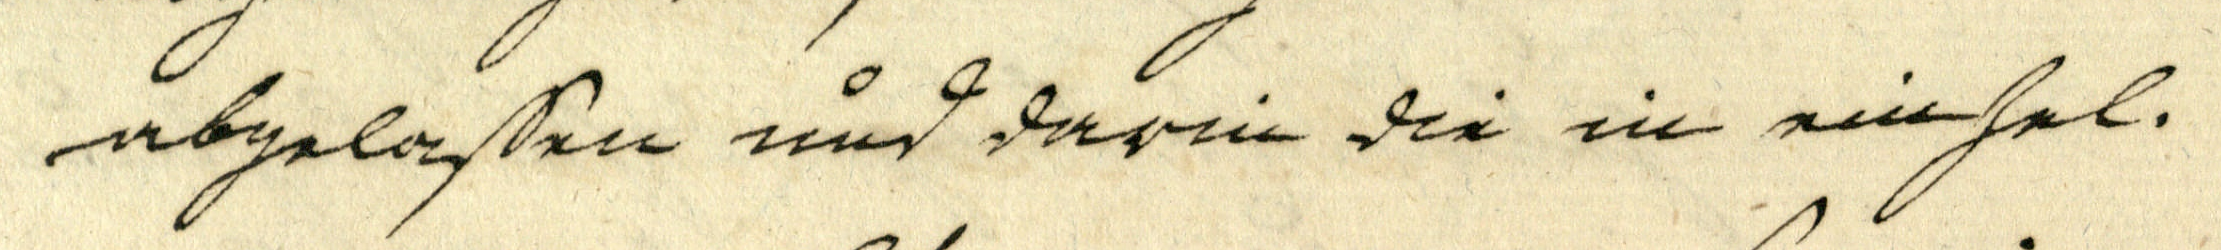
abgelassen und darin die in einzel¬
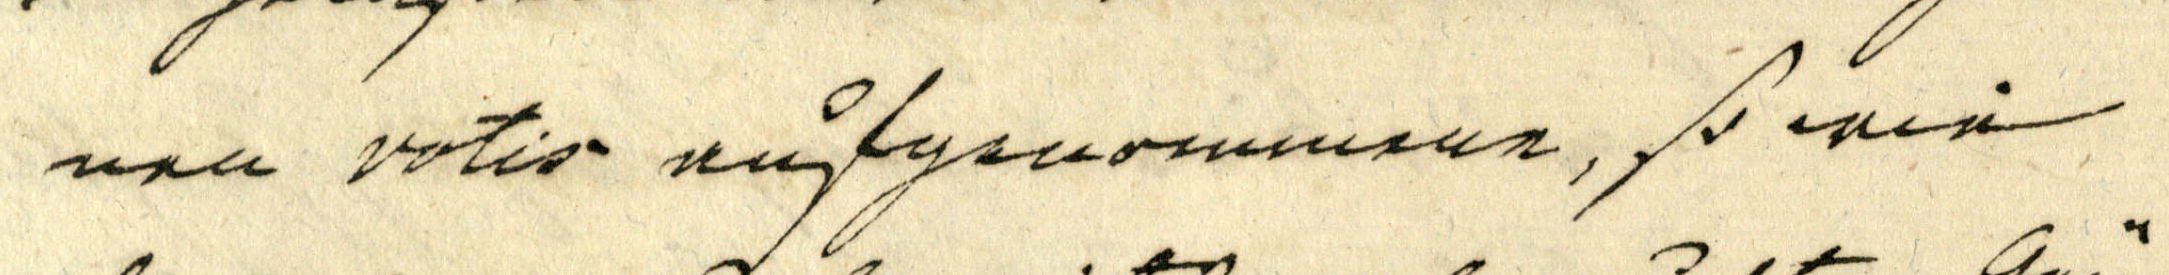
nen votis aufgenommene, so wie
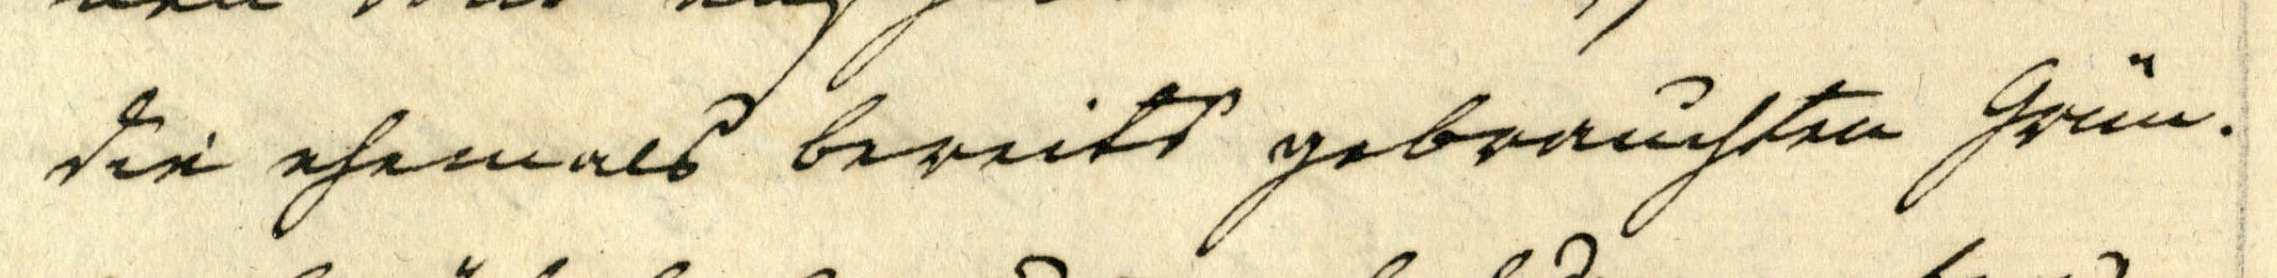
die ehemals bereits gebrauchten Grün¬
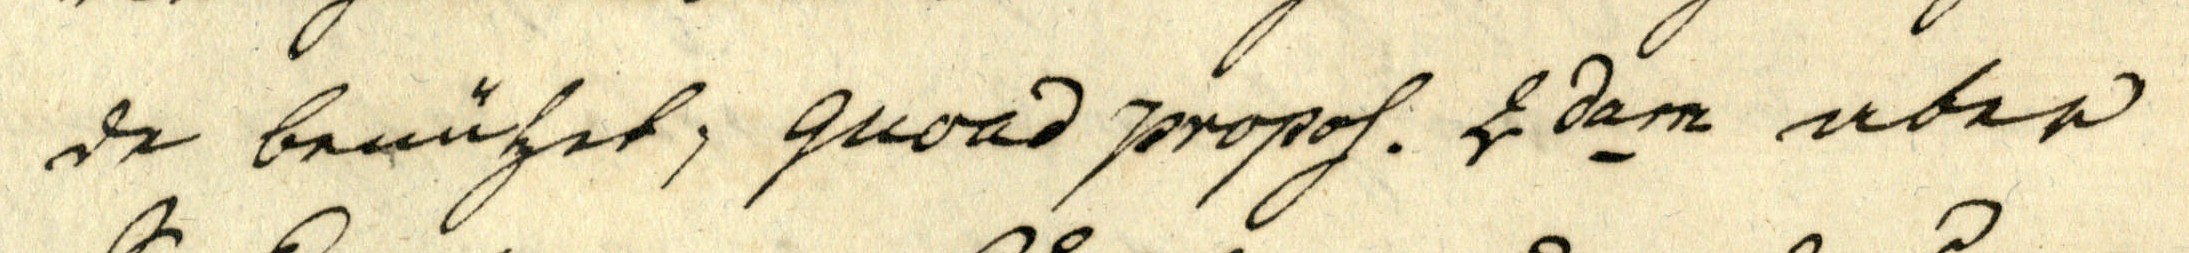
de bemühet, quoad propos. 2 dam aber
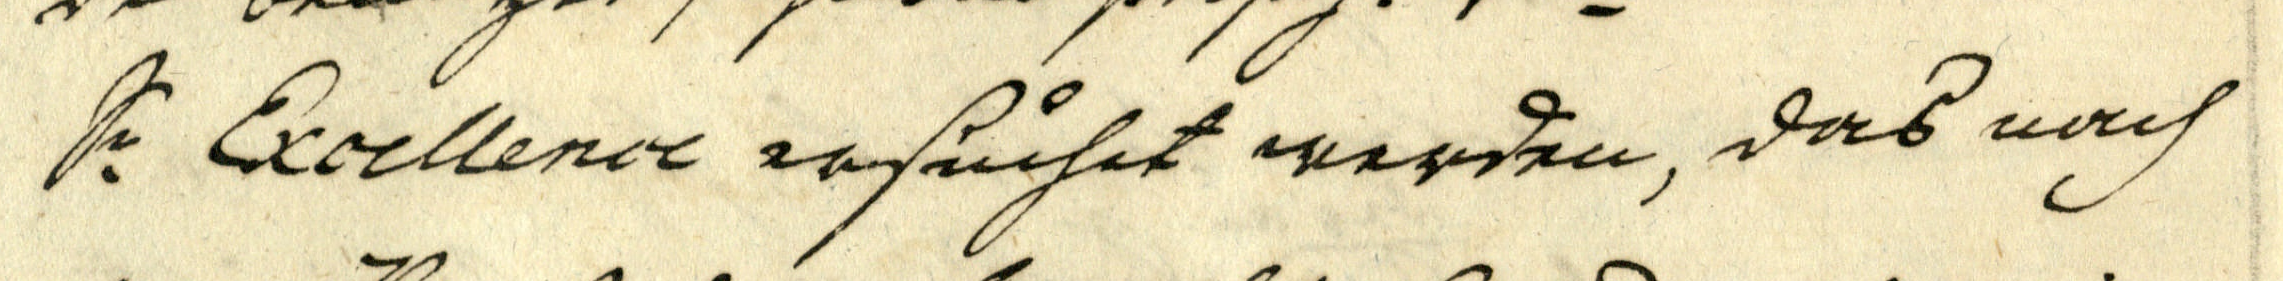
Sr Excellence ersucht werden, das nach
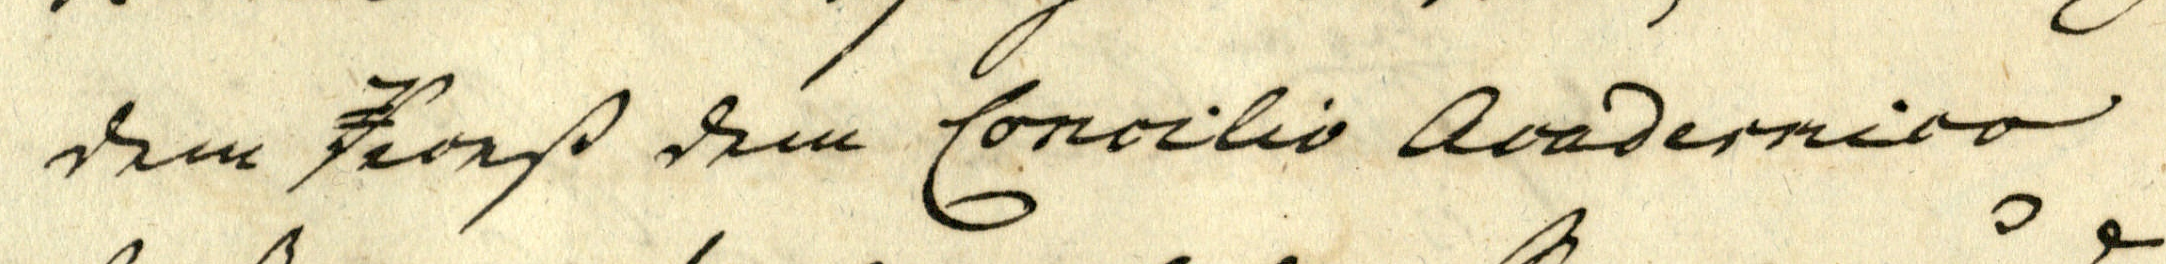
dem Receß dem Concilio Academico
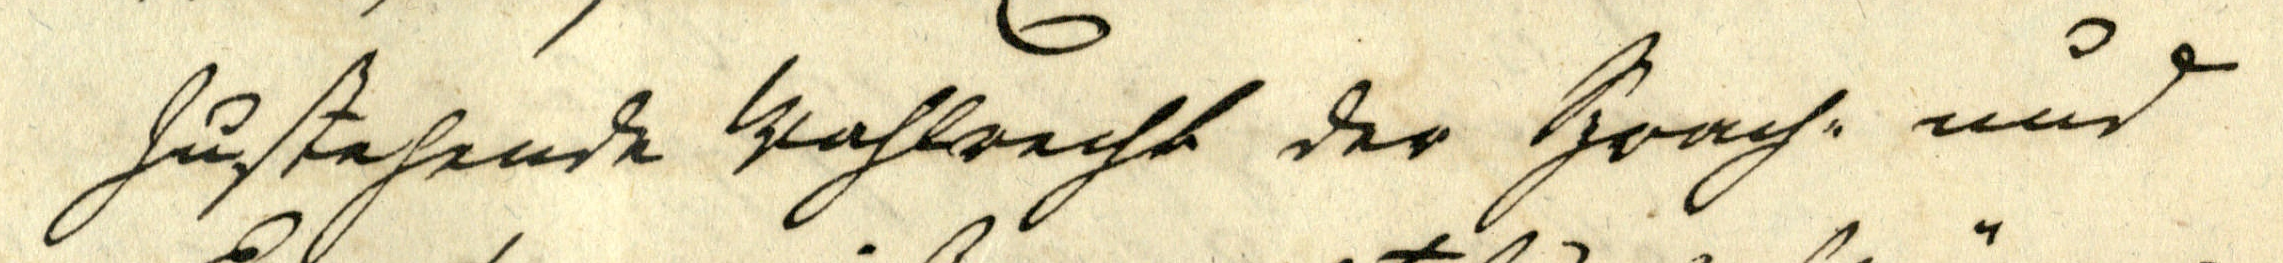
zustehende Wahlrecht der Sprach- und
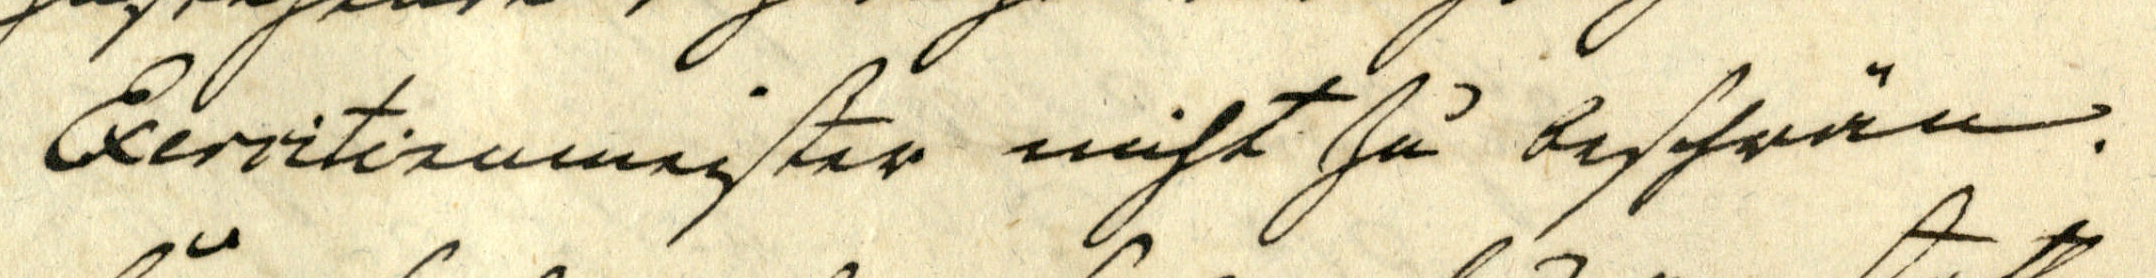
Exercitienmeister nicht zu beschrän¬
